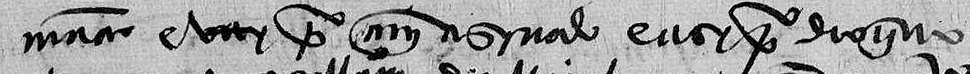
mãao e vay p̄o m̄y asynado e asy p̄o dioguo
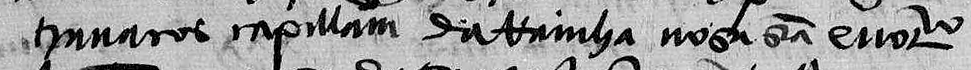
trauaços capellam da Rainha nosa sr̄a e notro
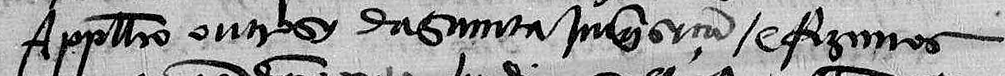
App̄llco outrosy da samta Jmq̄syçā / e fizemos
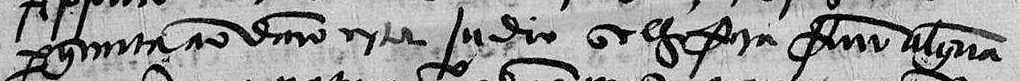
ꝑgunta ao ditto eytor Jndio se lhe fora feito al̄gua
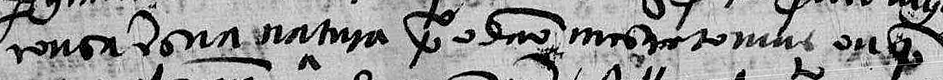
cousa ē sua natura p̄o o dito mestre tomas ou p̄o
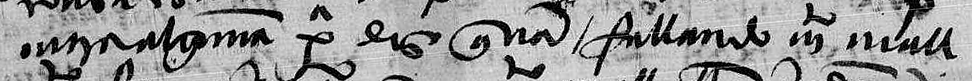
outra algūua pa dise q̄ nā / fallando mto mall
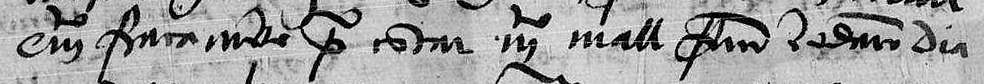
e mto fracamēte p̄o estar mto mall feito ē o dito dia
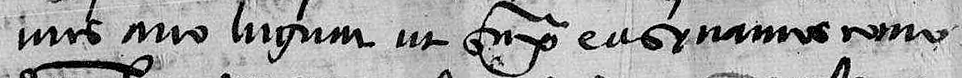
mes ano luguar ut sup̄ e asynamos como
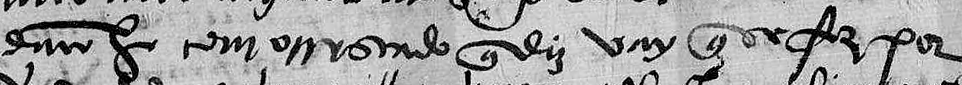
dito he com o rryscado q̄ diz vay q̄ se fez por
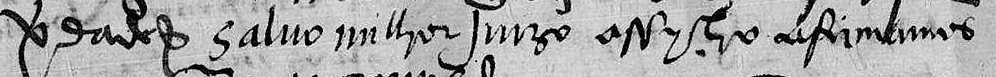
ꝟdade saluo milhor Juizo assy ho afirmamos
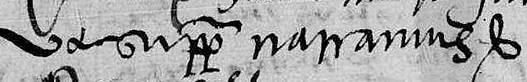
vt sup̄p narramus
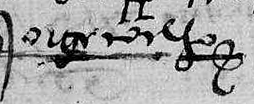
Jorge coelho
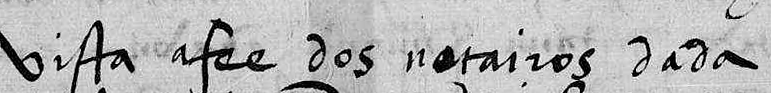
Vista a fee dos notairos dada
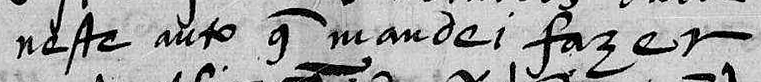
neste auto q̄ mandei fazer
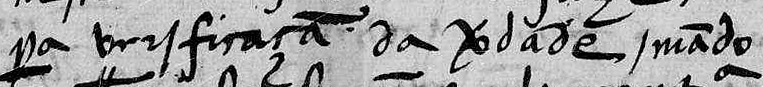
ꝑa verjficaçā da ꝟdade / mādo
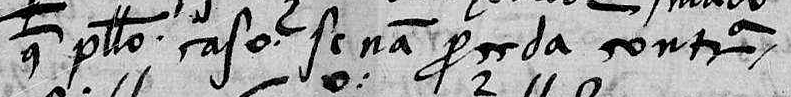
q̄ pl̄lo. caso se nā ꝓceda contra /
